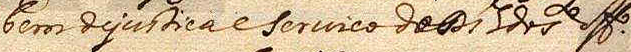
bem de justiça e seruiço de Ds̄ E do sto off.o
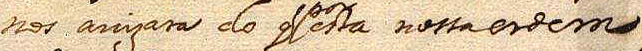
nos auizara do q̄ por esta nossa ordem
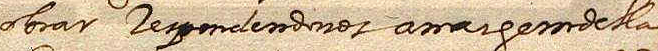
obrar Respondendonos a margem della
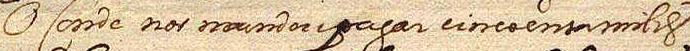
O Conde nos mandou pagar cincoenta mil rs̄
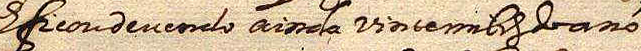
E ficou deuendo ainda vinte mil rs̄ do anō
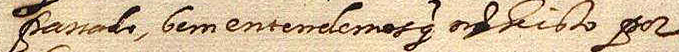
passado, bem entendemos q̄ naõ he isto por
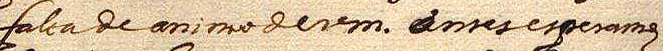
falta de animo de vm. antes esperamos
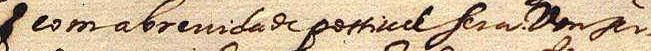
q̄ com a breuidade possiuel sera Vm ser
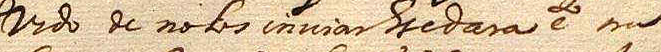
vido de no los inuiar E se dara cto na
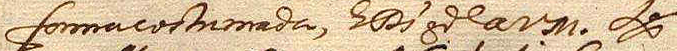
forma costumada, E Ds̄ gde a vm. Lxa
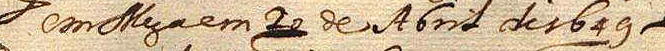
em Meza em 20 de Abril de 1649
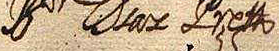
Bor Diaz Pretto
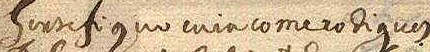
Sertefiquo eu iacome rodrigues
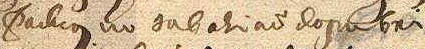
Pachequo tabaliaõ do pubri
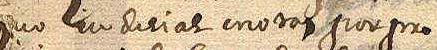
quo iudisial e notas por pro
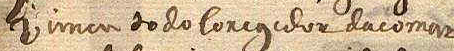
vimento do Coregedor da comar
